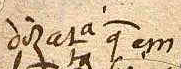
diz a ta q̄ em
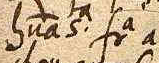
hūa sta. fra a
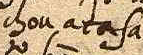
chou a casa
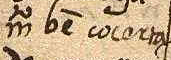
mto bē cocerta
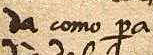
da como ꝑa
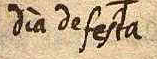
dia de festa
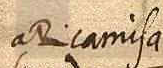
a R. camisa
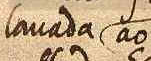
lauada ao
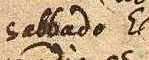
sabbado E
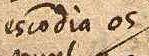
escōdia os
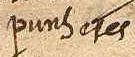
punhetes
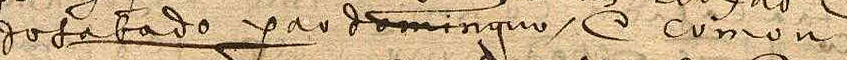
do sabado ꝑa o dominguo / e com ou
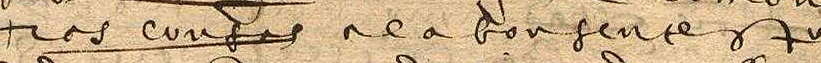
tras cousas acabou seu testo
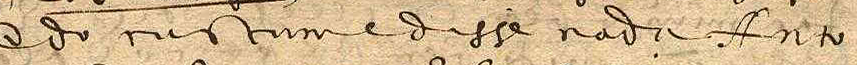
e do custume disse nada Anto
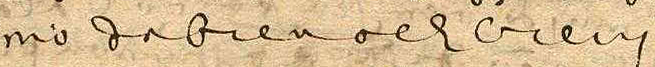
nio dabreu o escreuj
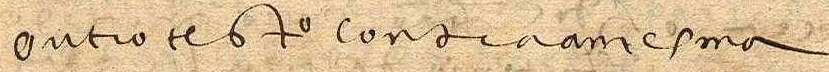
outro testo contra a mesma
